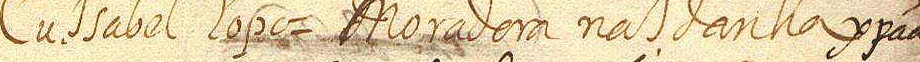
Eu Isabel Lopez moradora na Idanha xpāa
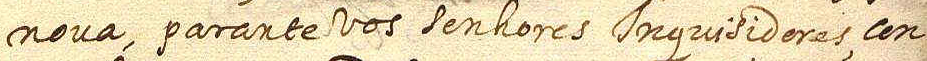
noua, parante vos senhores Inquisidores, con
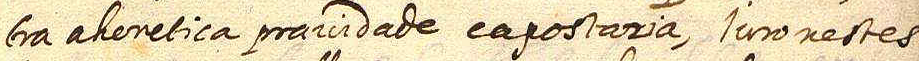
tra a heretica prauidade e apostazia, Iuro nestes
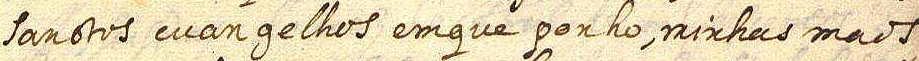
Sanctos euangelhos em que ponho, minhas maos
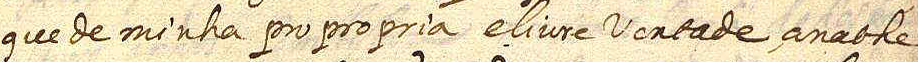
que de minha propropria e liure vontade, anathe
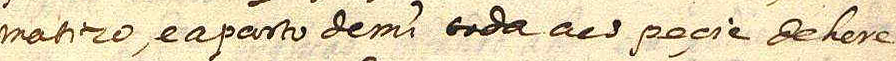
matizo, e aparto de mī toda a especie de here
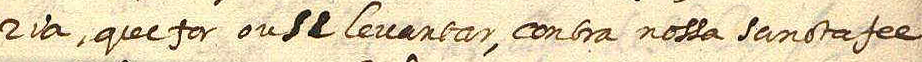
zia, que for ou se leuantar, contra nossa sancta fee
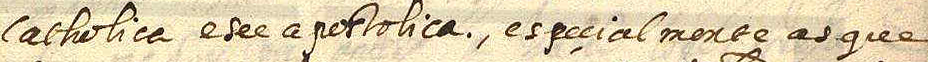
catholica e see apostolica, especialmente as que
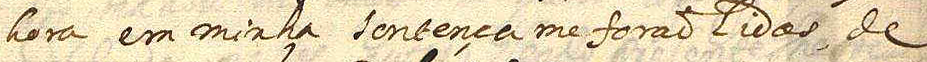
hora em minha sentença me foraõ lidas, de
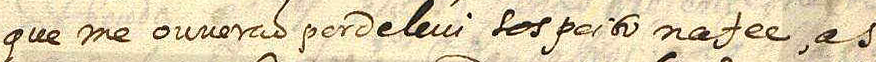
que me ouueraõ per de leui sospeito na fee, as
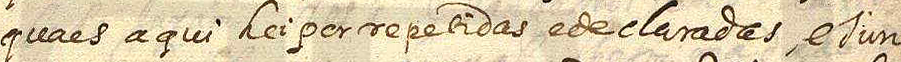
quaes aqui hei per repetidas e declaradas, e Iuro
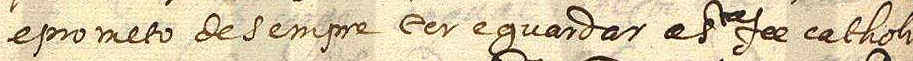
e prometo de sempre ter e guardar a sta fee catholi
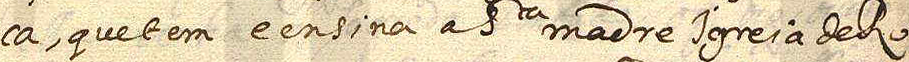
ca, que tem e ensina a sta madre Igreia de Ro
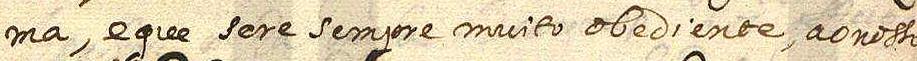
ma, e que sere sempre muito obediente, ao nosso
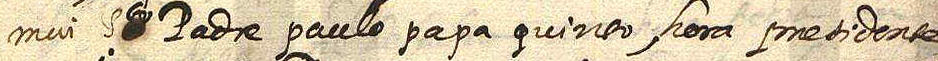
mui sto Padre paulo papa quinto, hora presidente
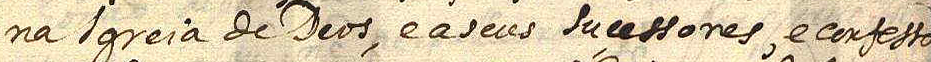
na Igreia de Deos, e a seus sucessores, e confesso
